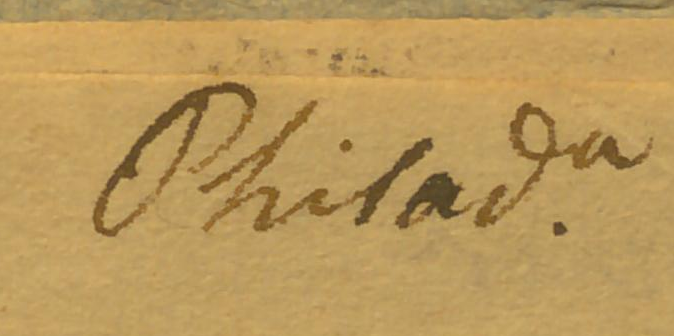Philad^a.
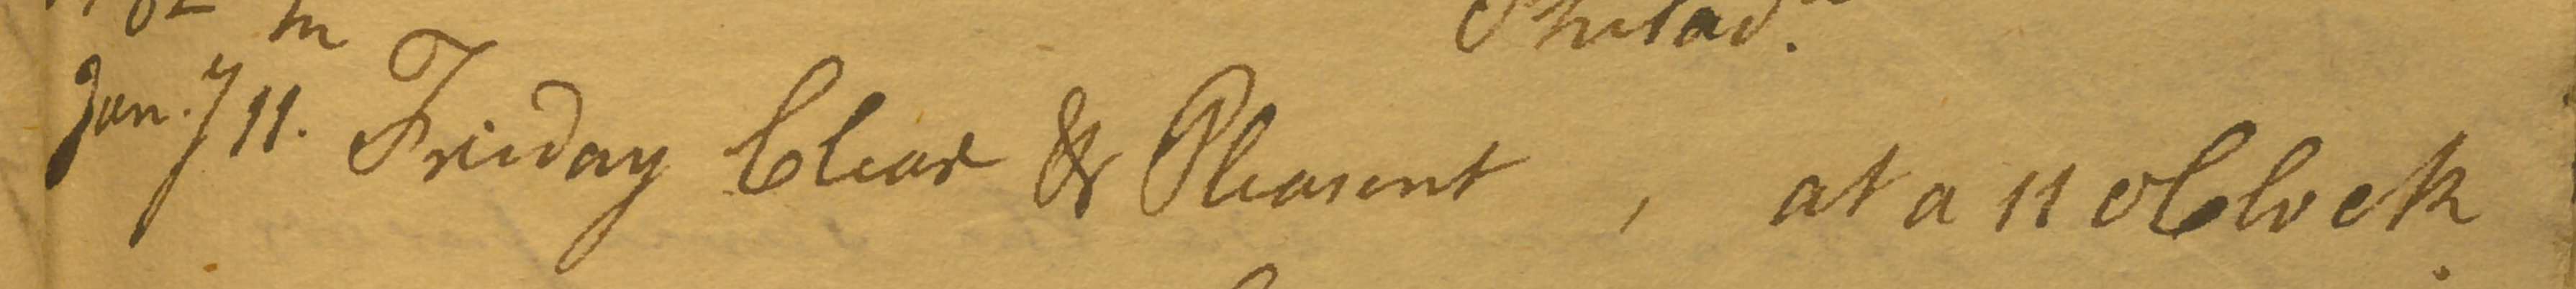Jen^y 11th Friday Clear & Pleasent, at a 11 oClock
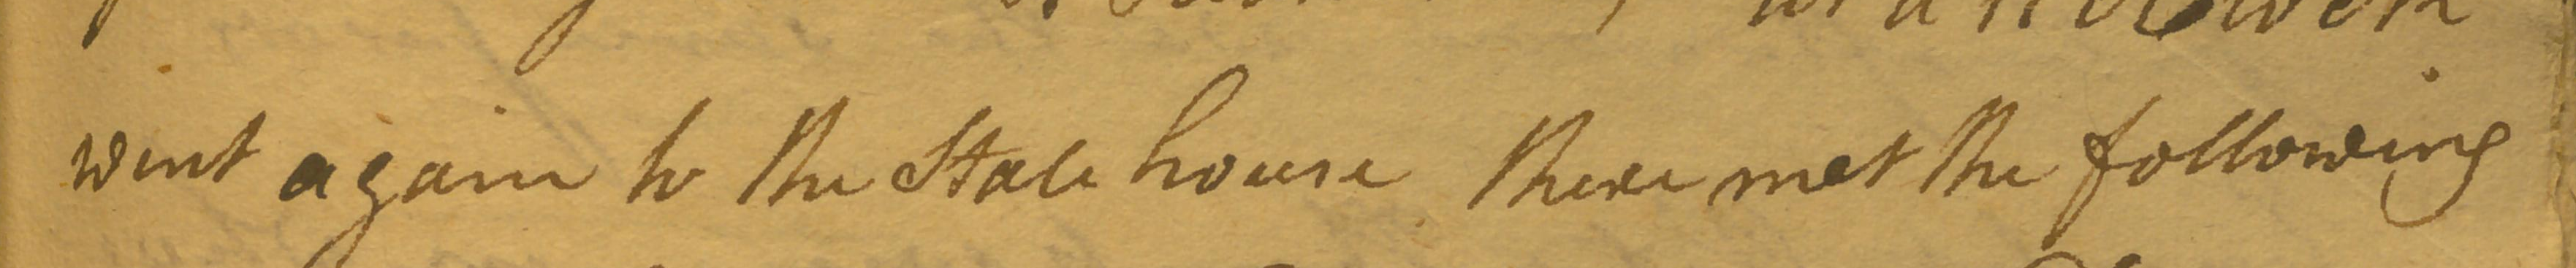went again to the State house there met the following
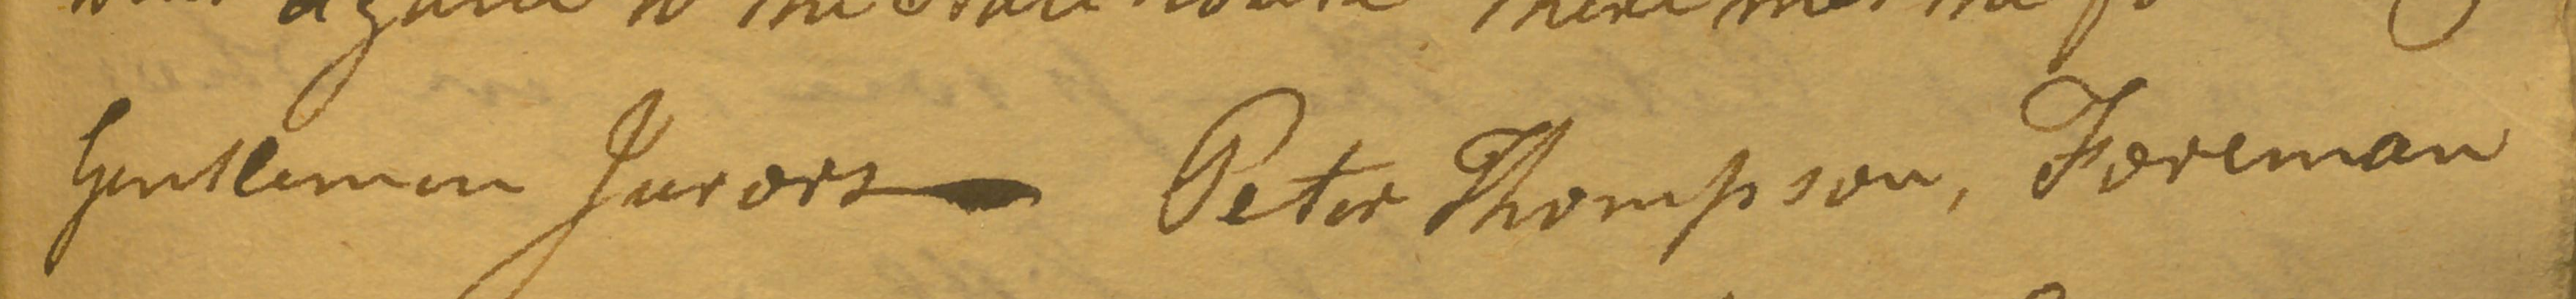Gentlemen Jurors Peter Thompson, Foreman
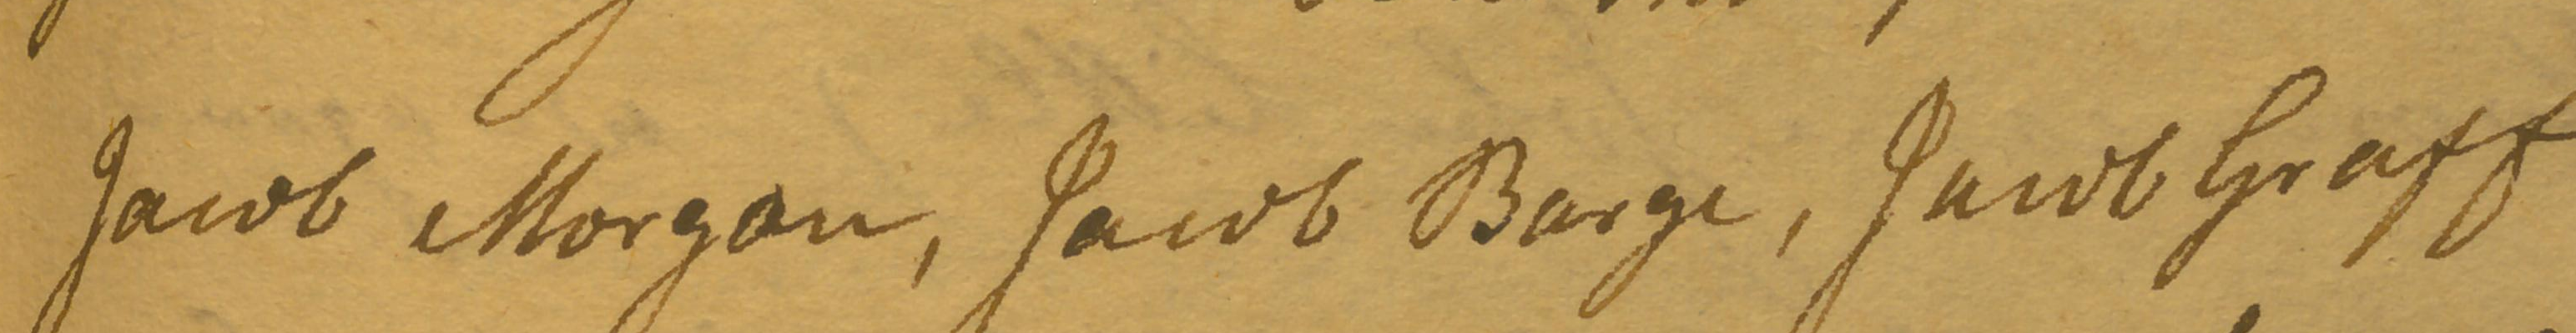Jacob Morgon, Jacob Barge, Jacob Graff
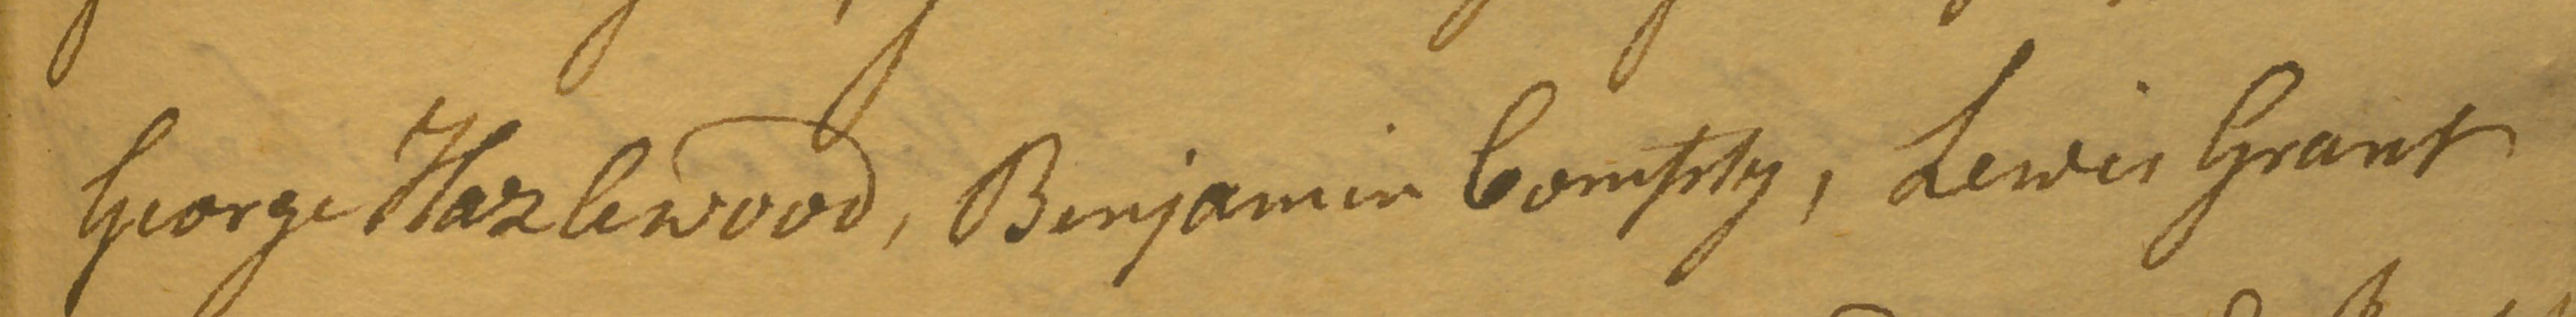George Hazlewood, Benjamin Compty, Lewis Grant
